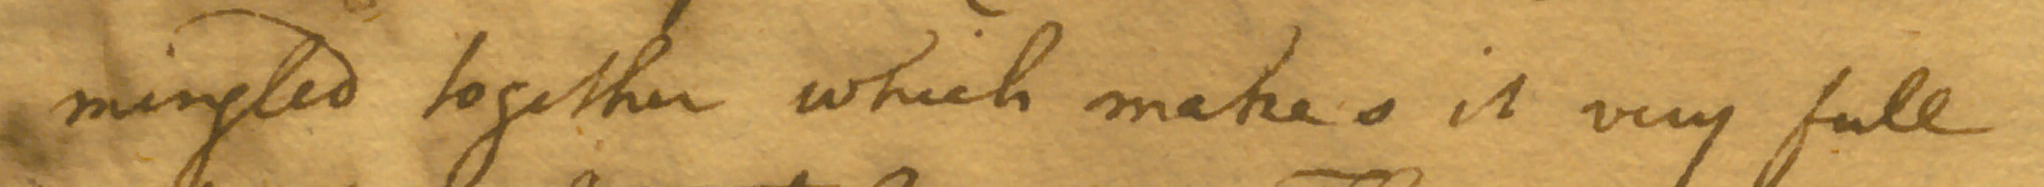mingled together which makes it very full
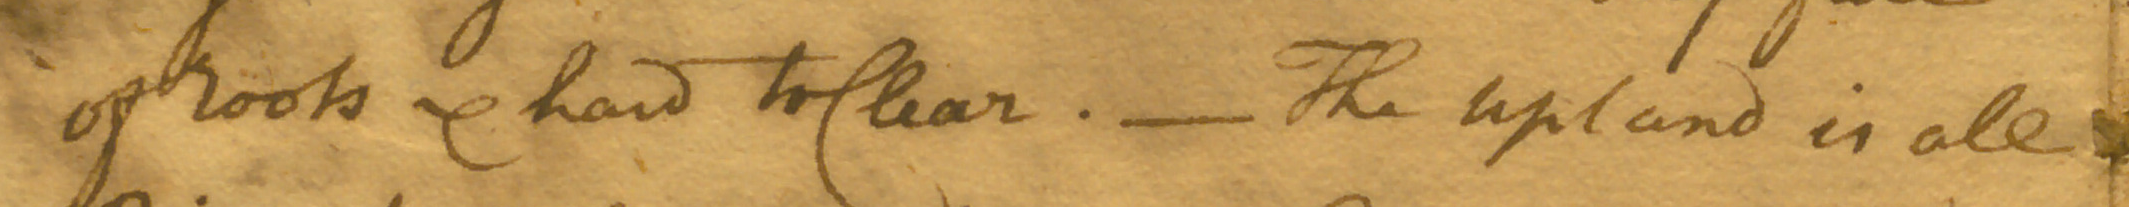of roots & hard to Clear.- The upland is all
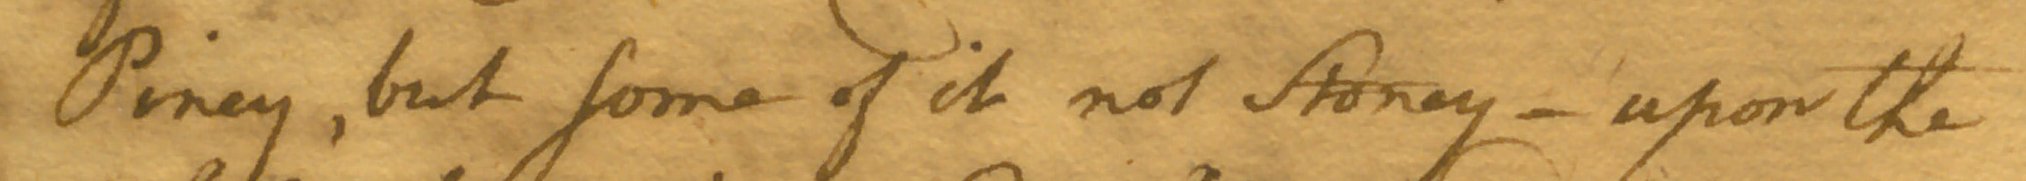Piney, but some of it not Stony- upon the
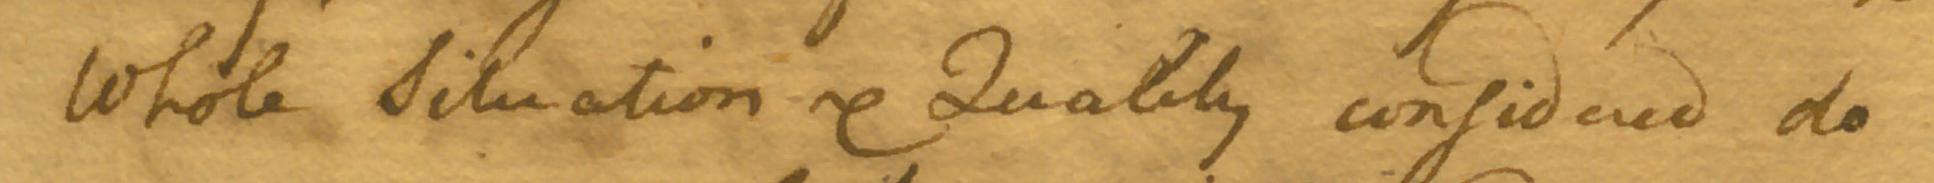whole situation & Quality considered do
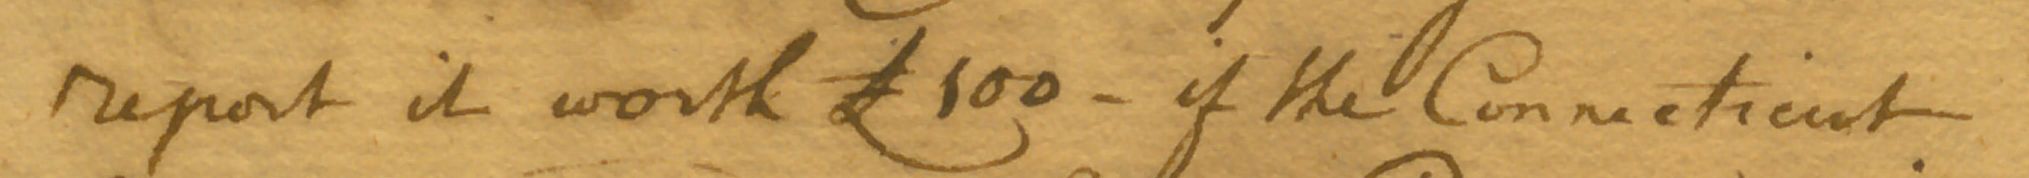report it worth £100- if the Connecticut
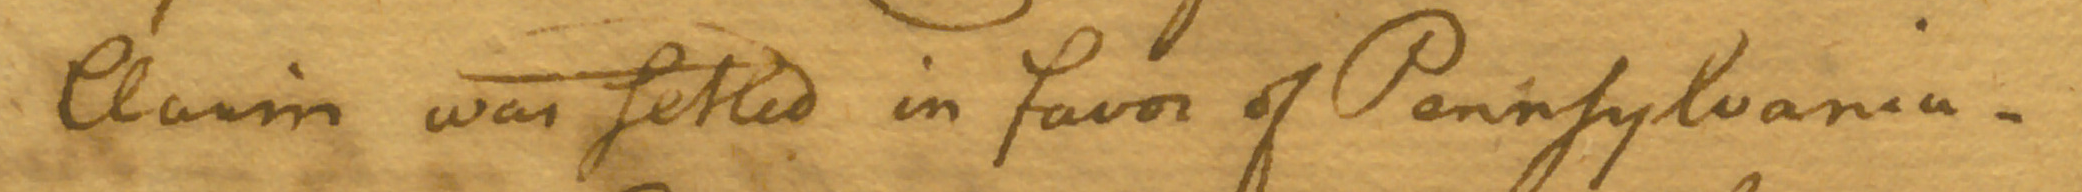Claim was setled in favor of Pennsylvania.
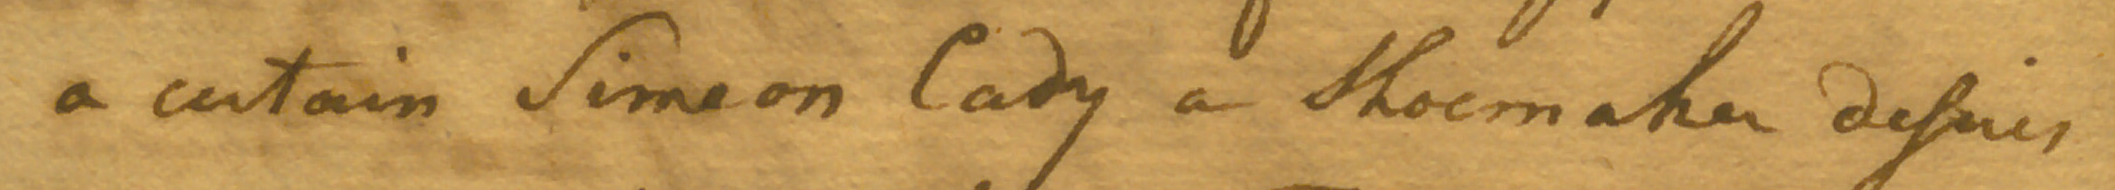a certain Simeon Cady a Shoemaker desires
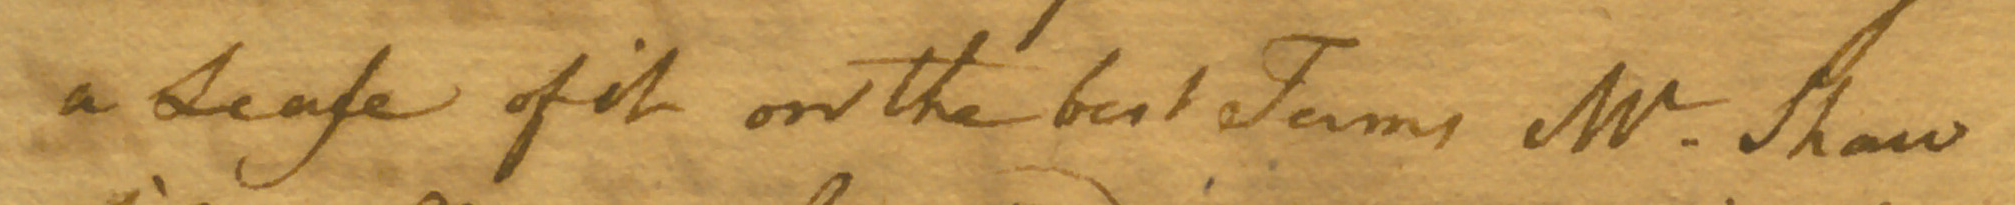a Lease of it on the best Terms M^r. Shaw
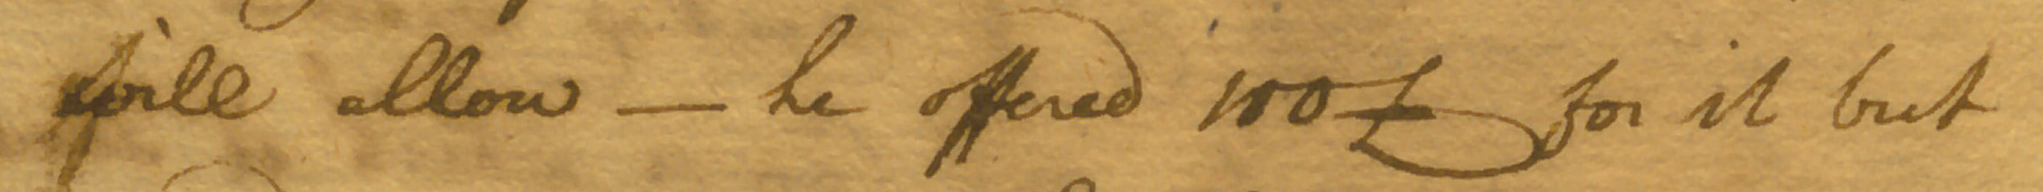will allow- he offered 100£ for it but
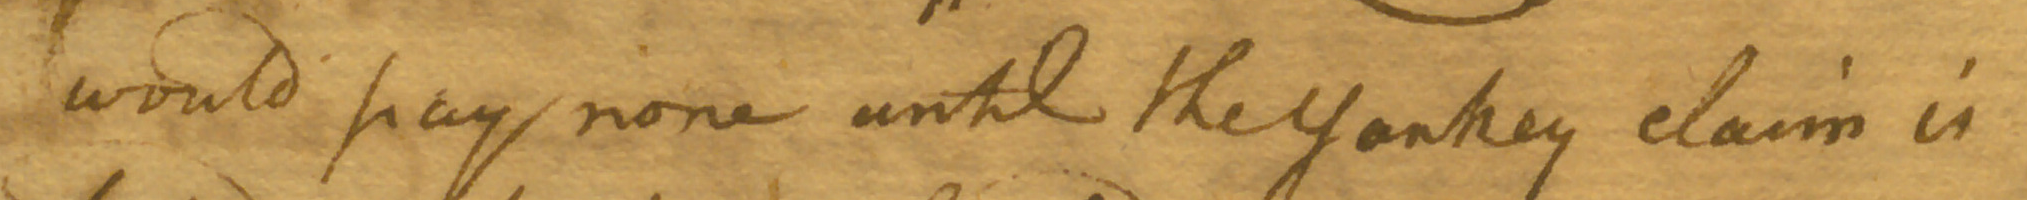would pay none until the Yankey claim is
